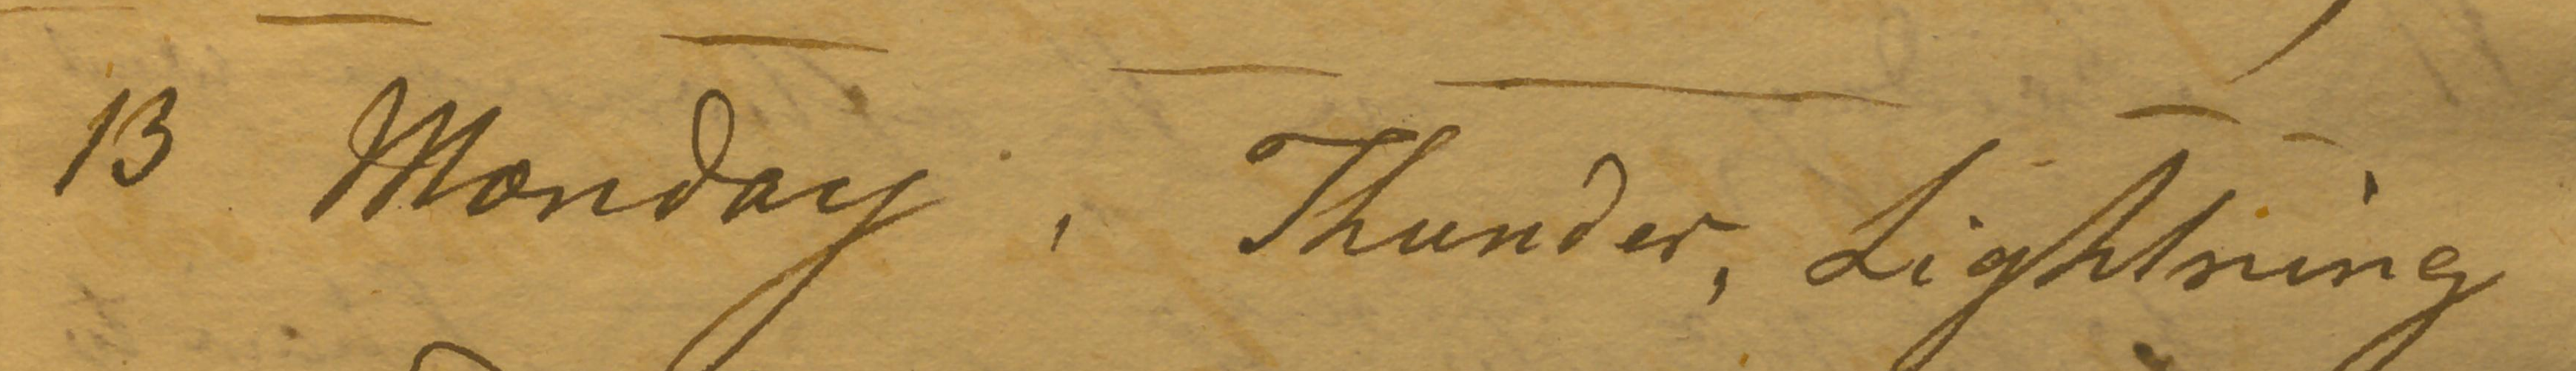13 Monday. Thunder, Lightning
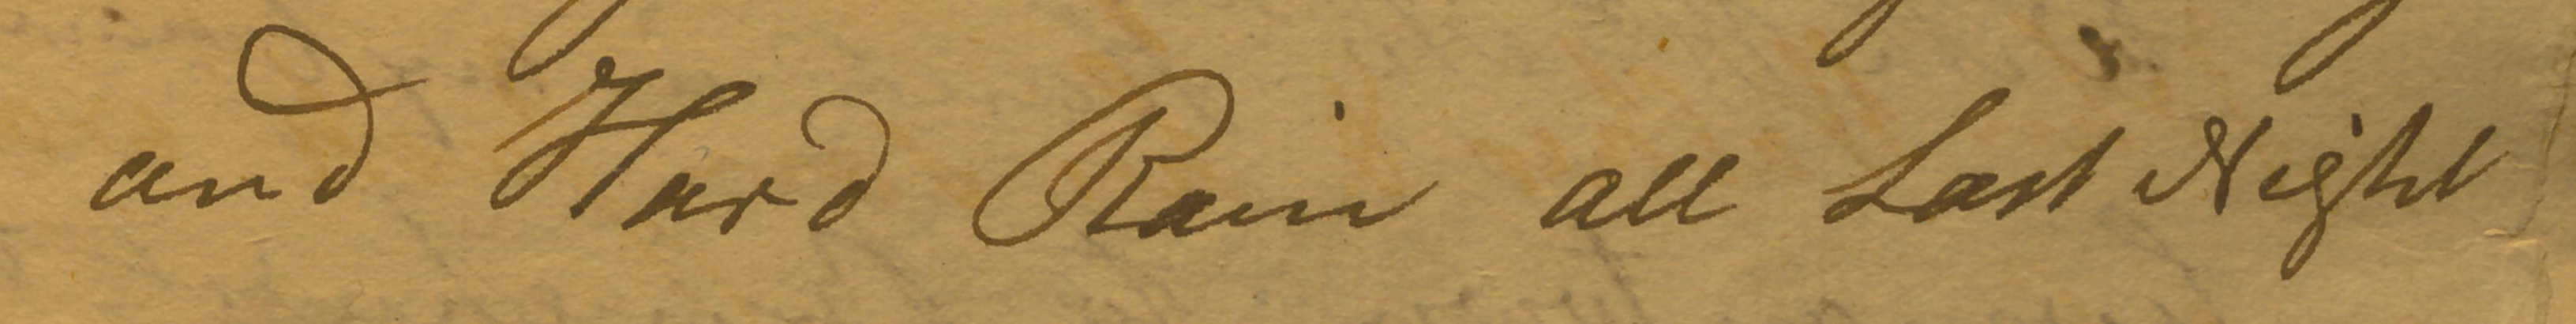and Hard Rain all Last Night
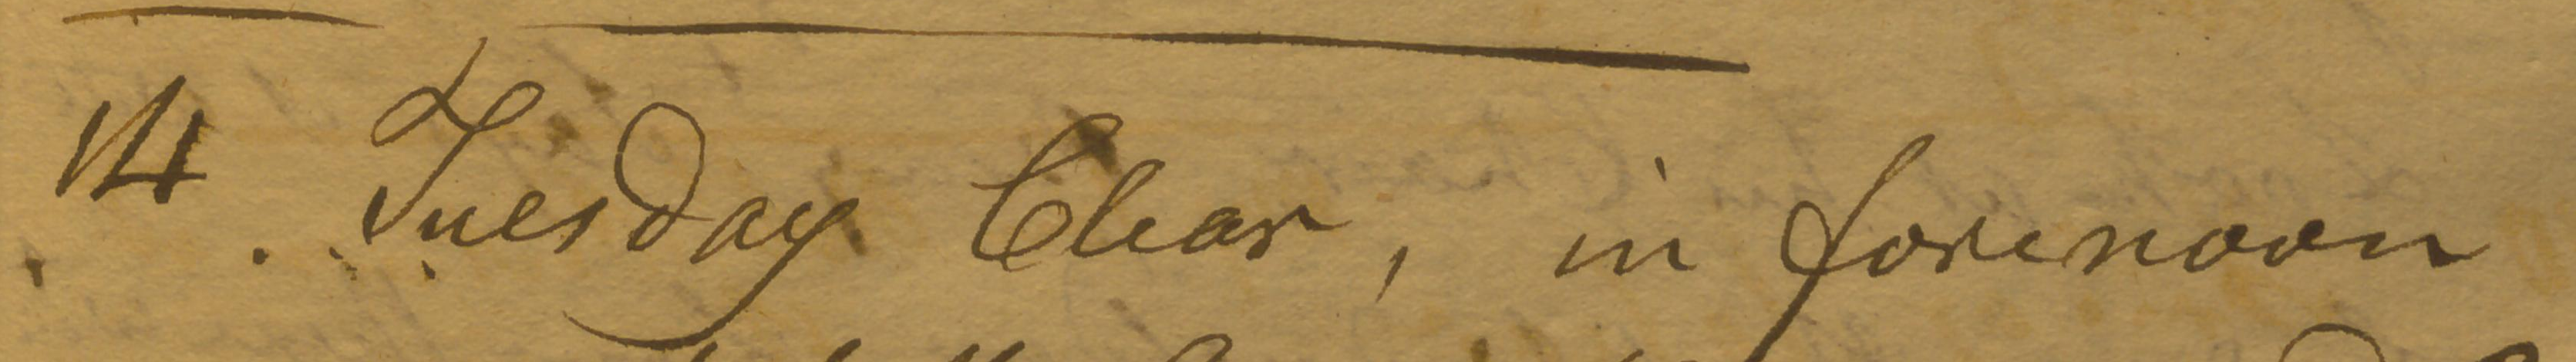14 Tuesday. Clear, in forenoon
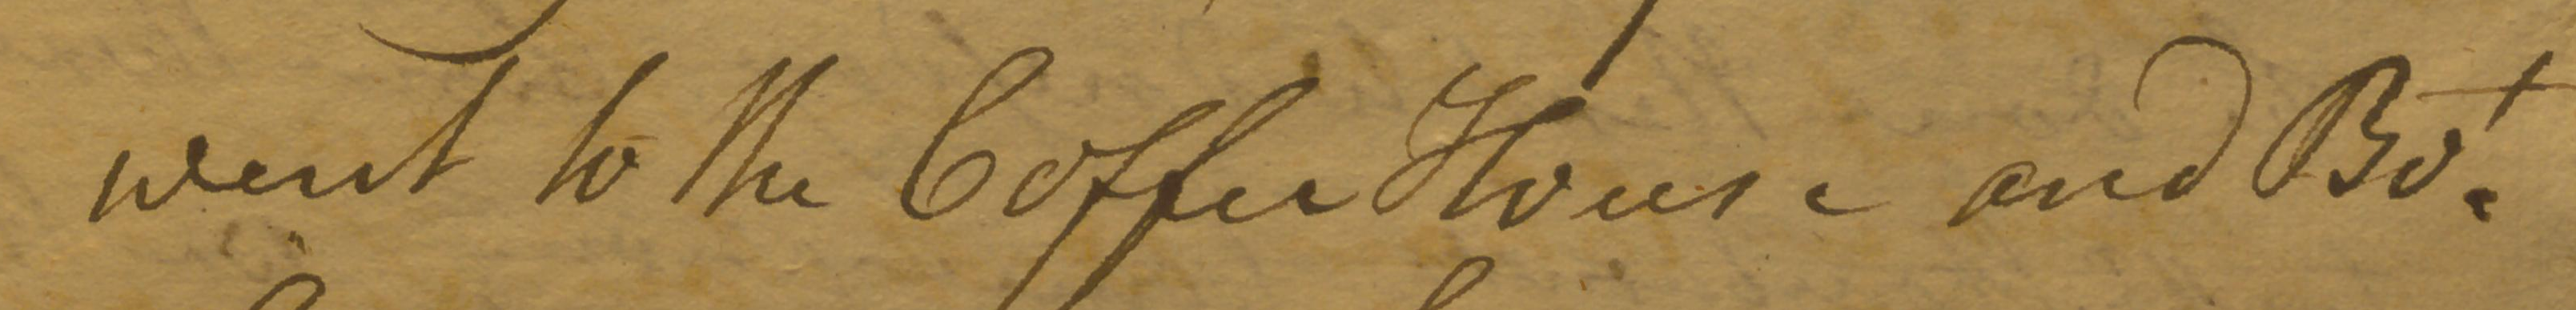went to the Coffec House and Bo^t.
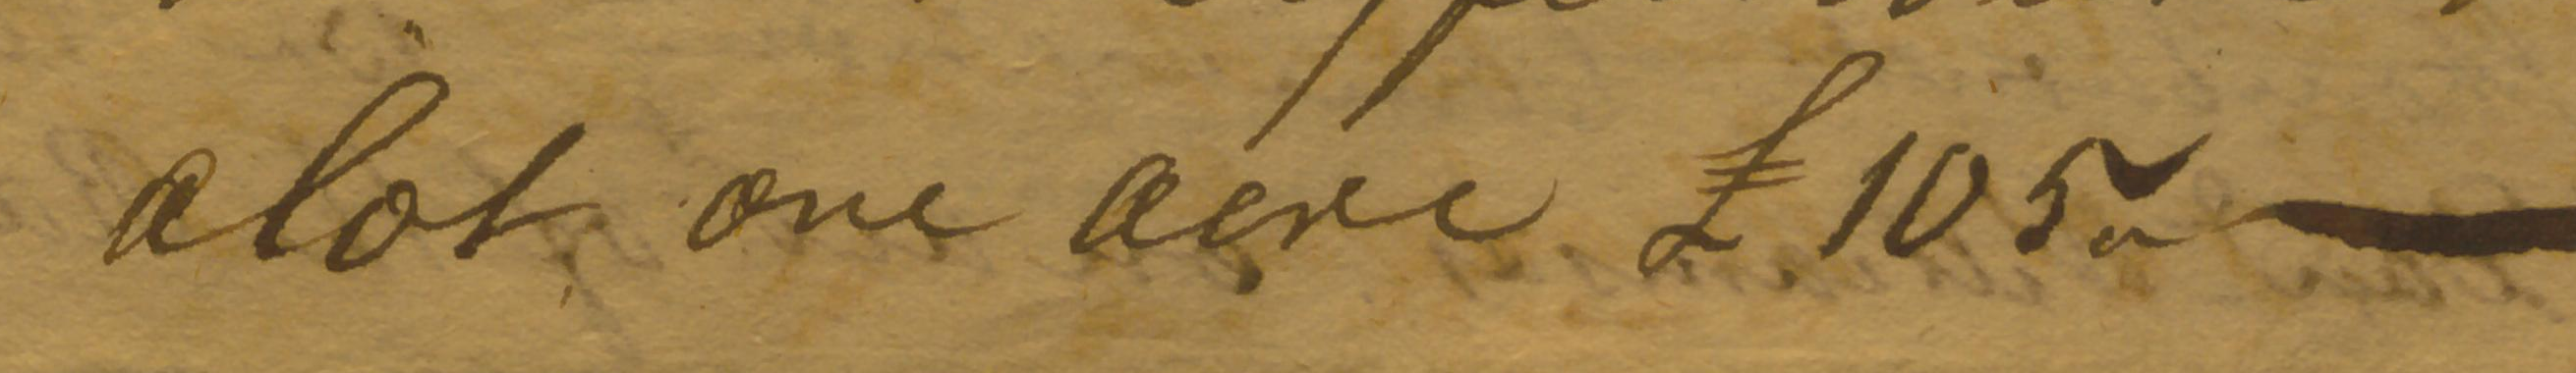a lot one acre £105-
